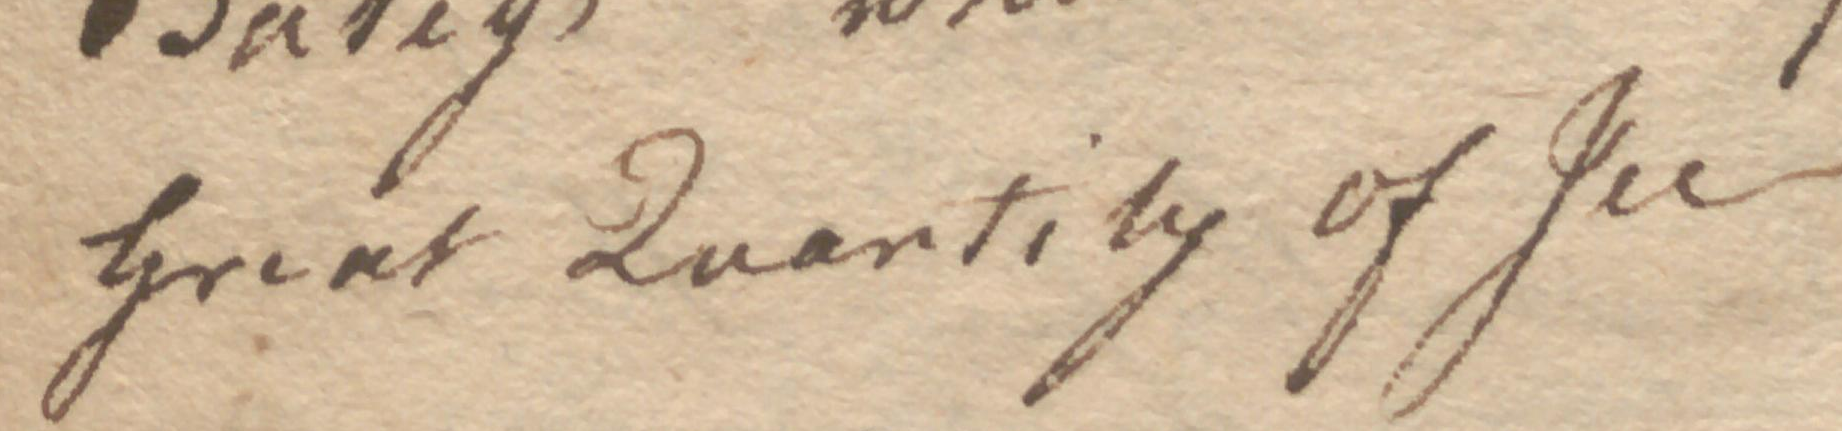Great Quantity of Ice
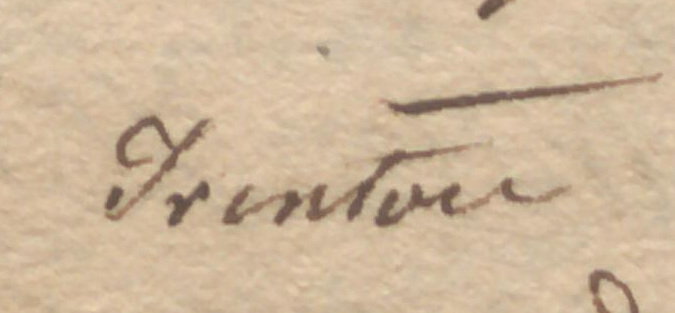Trenton
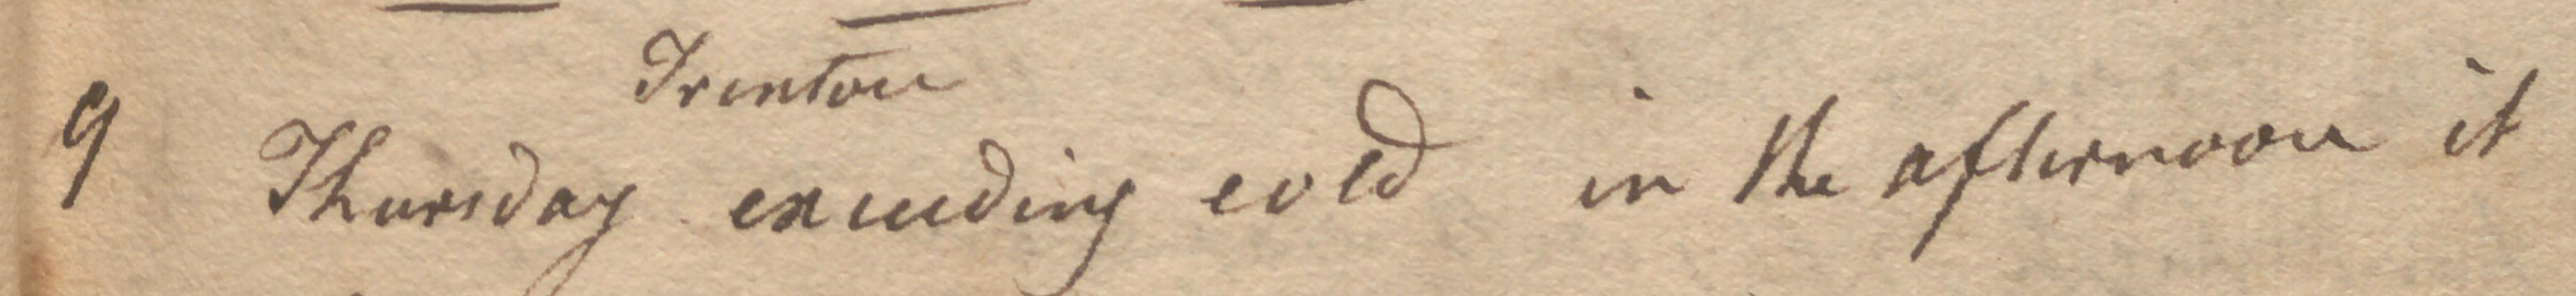9 Thursday exceeding cold in the afternoon it
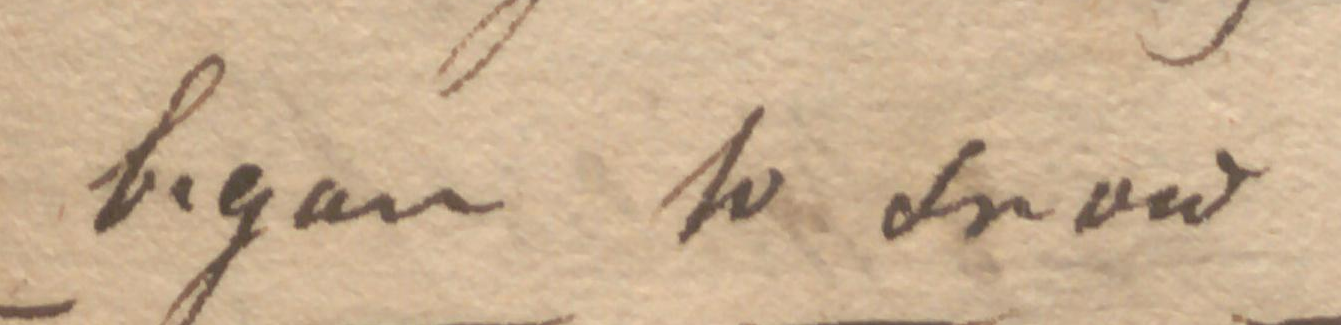began to snow
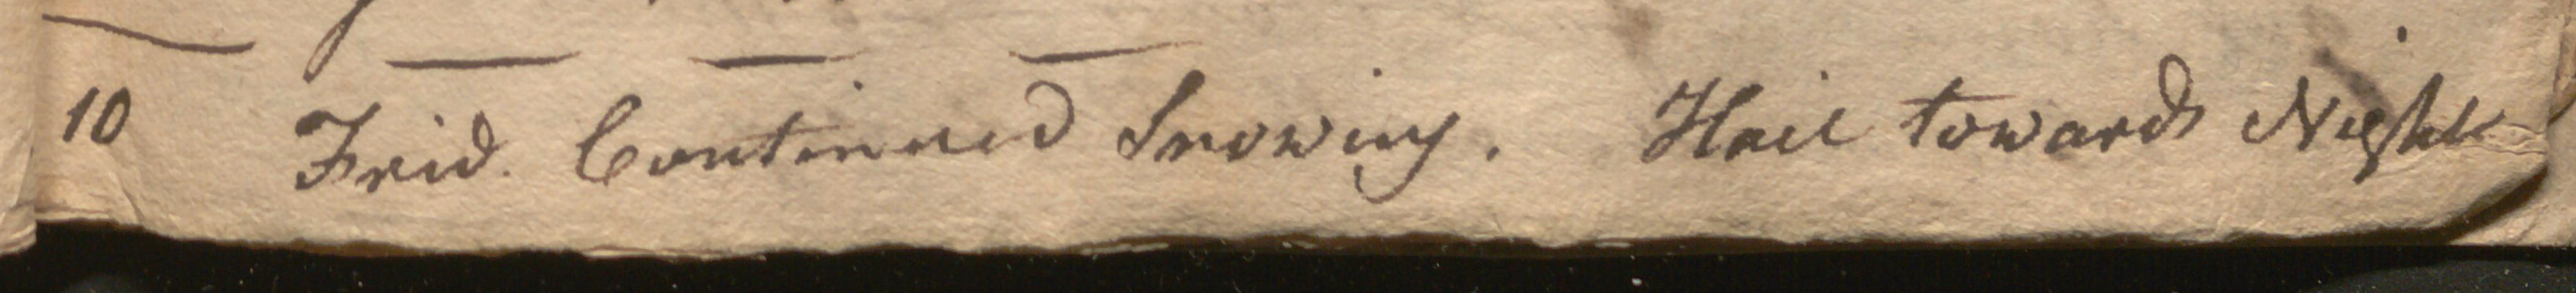10 Frid. Continued Snowing. Hail towards Night
